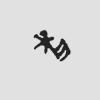利
